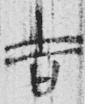吉
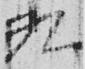九
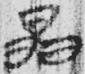晶
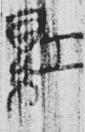○（鴻）
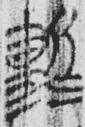漸
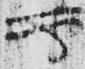于
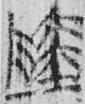陸
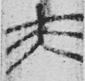夫
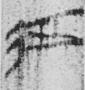征
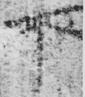不
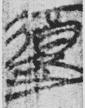○（復）
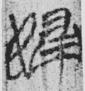婦
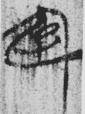孕
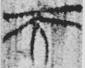而
